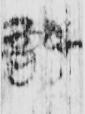○（信）
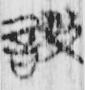○（察）
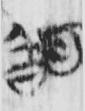○（聞）
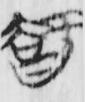智（知）
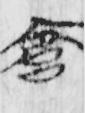舒
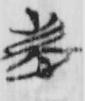慶
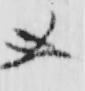之
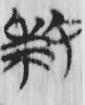殺
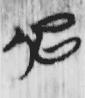○（宣）
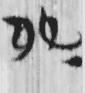卯
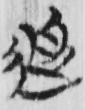逾
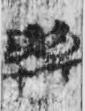與
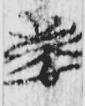慶
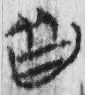皆
